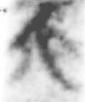六
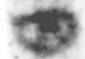四
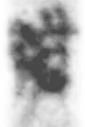鞁
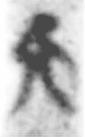六
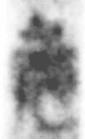○（轡）
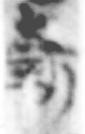新（新）
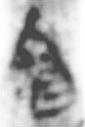官
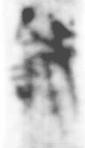○（令）
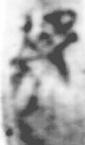欹
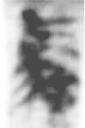馭（御）
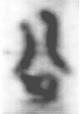公
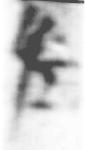○（左）
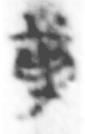革
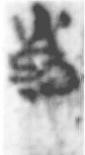兼
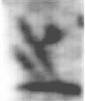之
